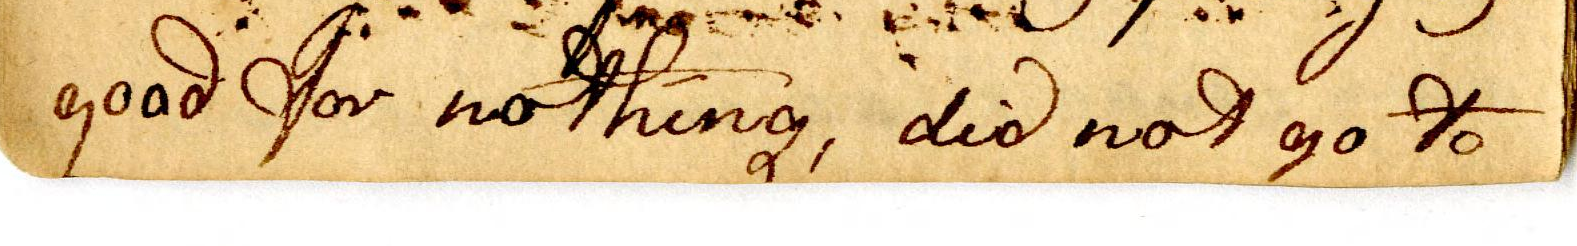good for nothing, did not go to
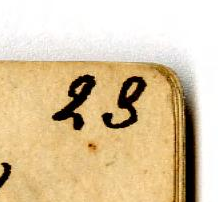23
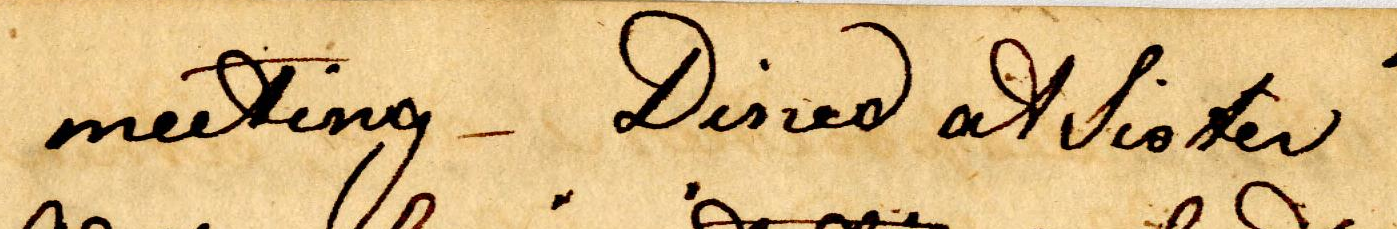meeting- Dined at Sister
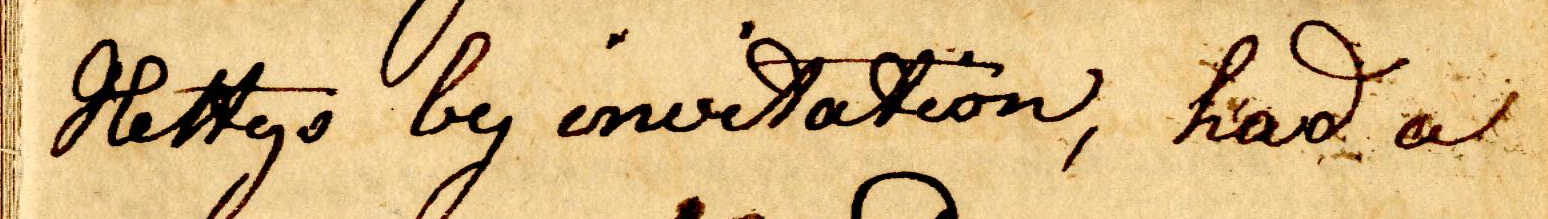Hettys by invitation, had a
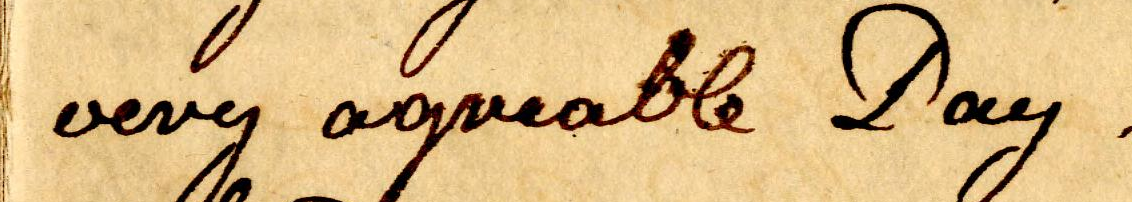very agreable Day
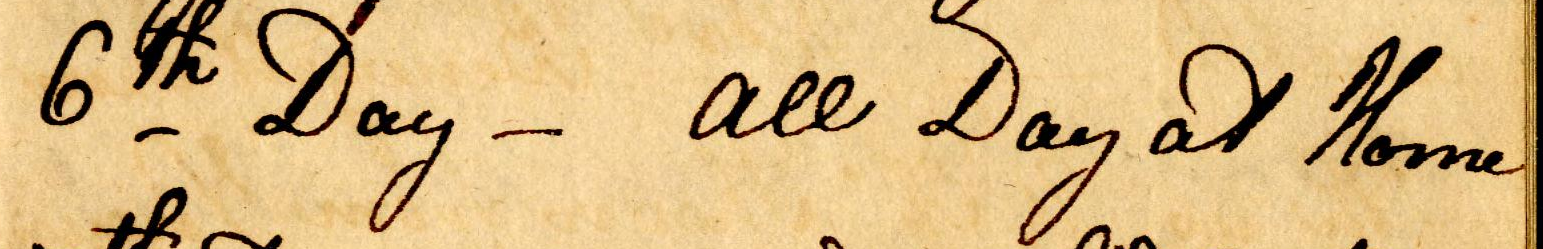6^th Day- all Day at Home
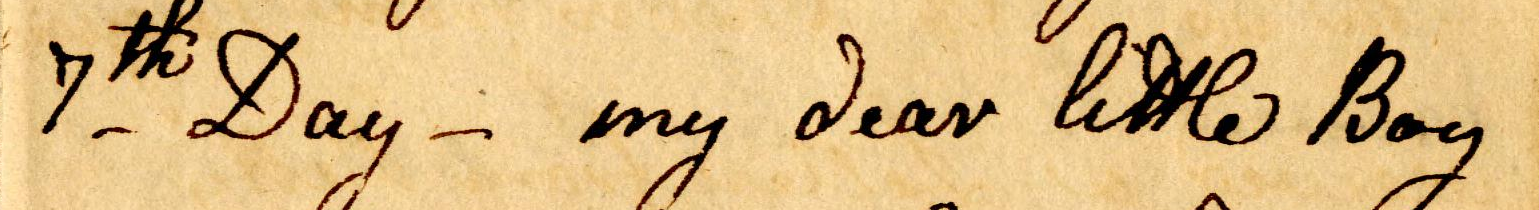7^th Day- my dear little Boy
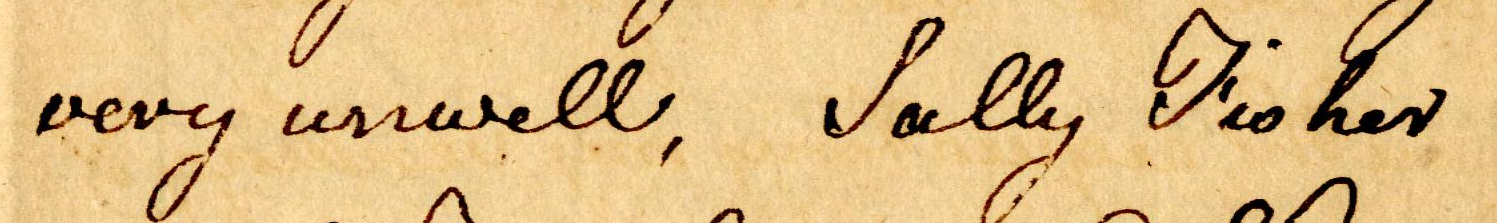very unwell, Sally Fisher
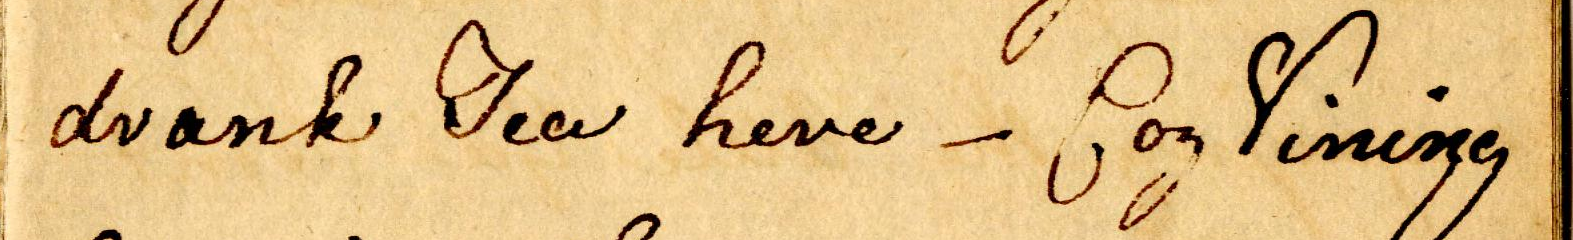drank Tea here- Coz Vining
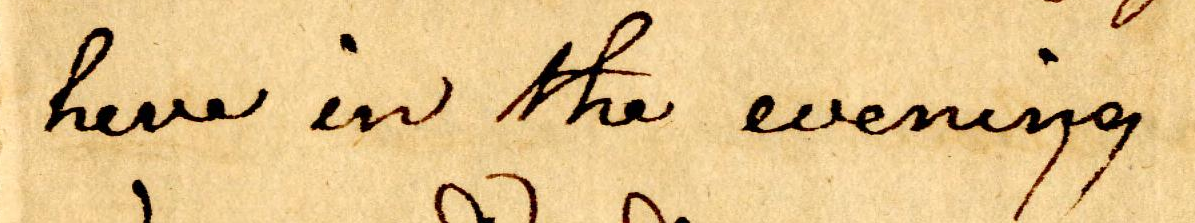here in the evening
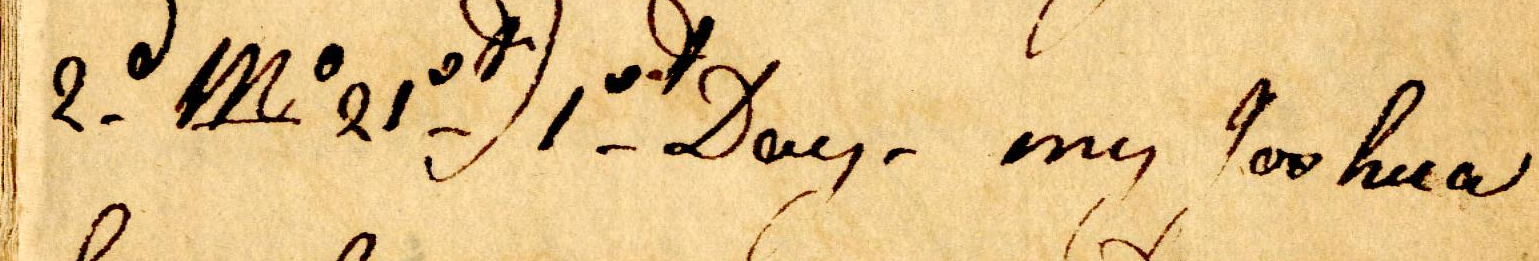2^d M^o 21^st) 1^st Day- my Joshua
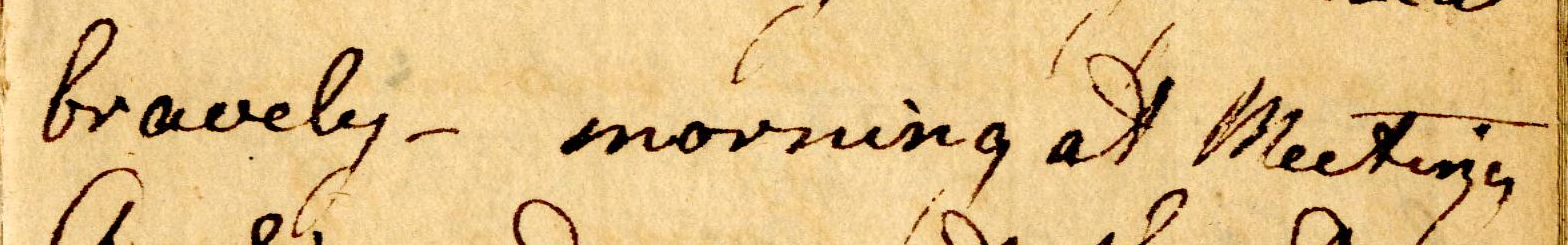bravely- morning at Meeting
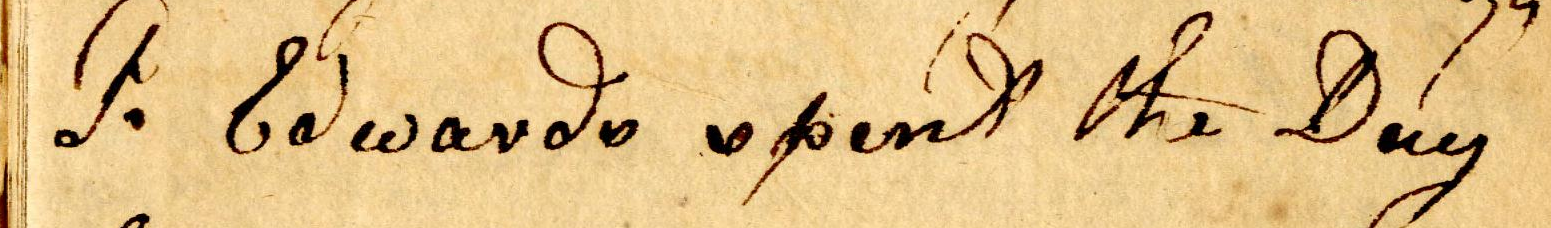P. Edwards spent the Day
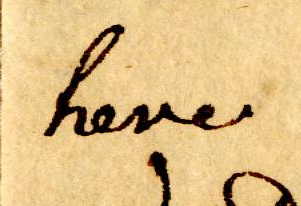here
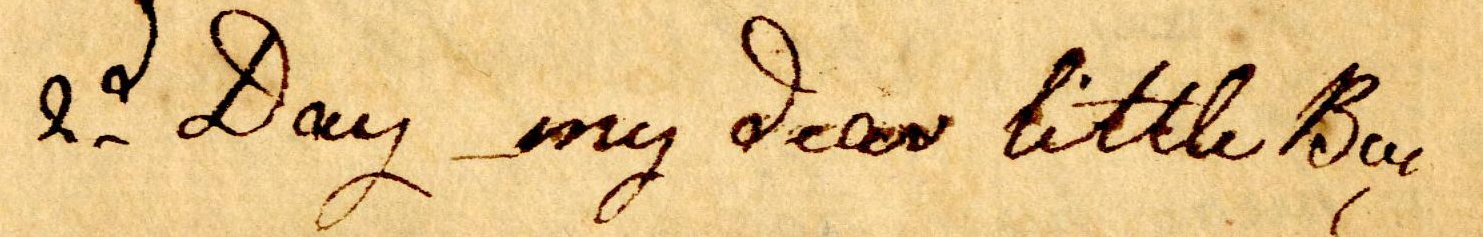2^d Day- my dear little Boy
